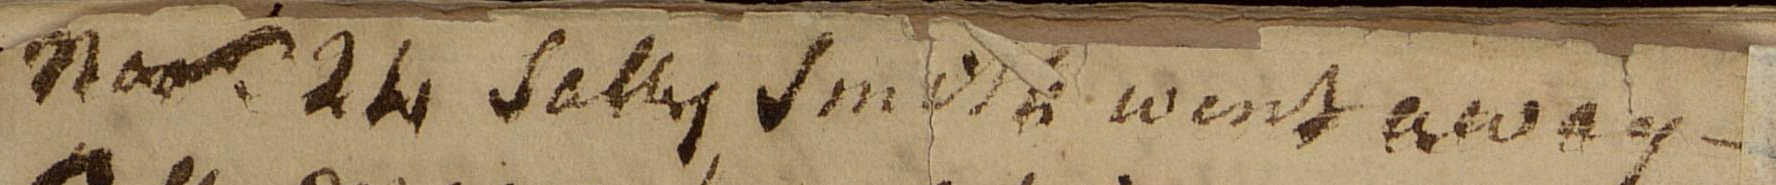Nov^r. 24 Sally Smith went away-
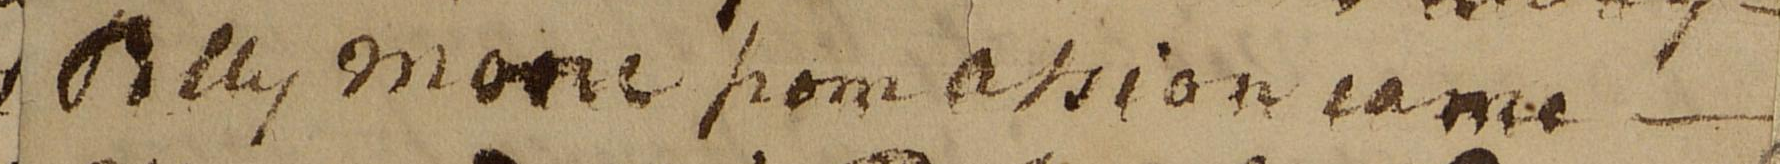Polly Moor from Atsion came-
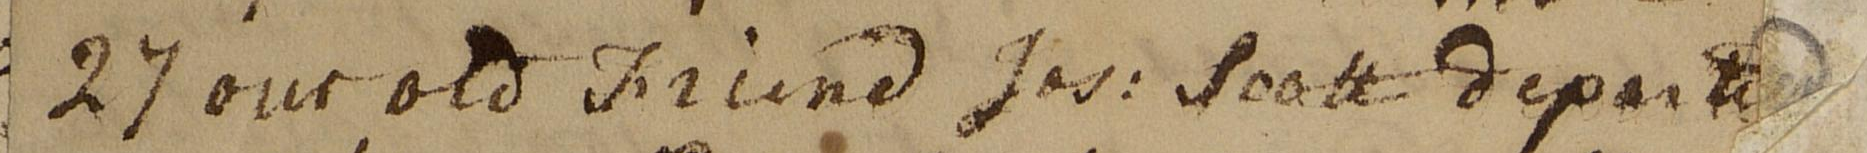27 our old Friend Jos: Scott departed
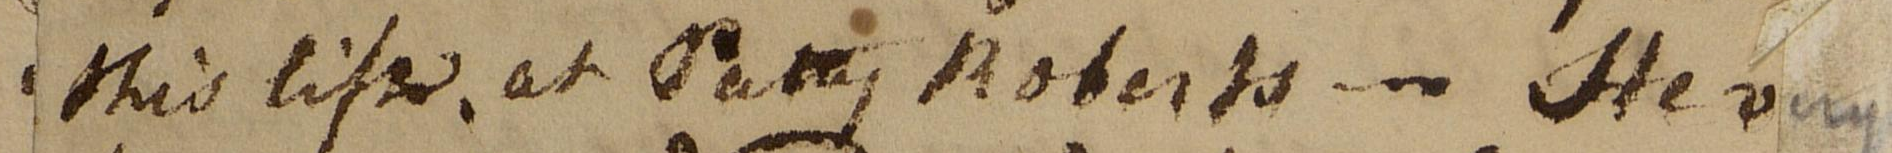this life, at Patty Roberts- He very
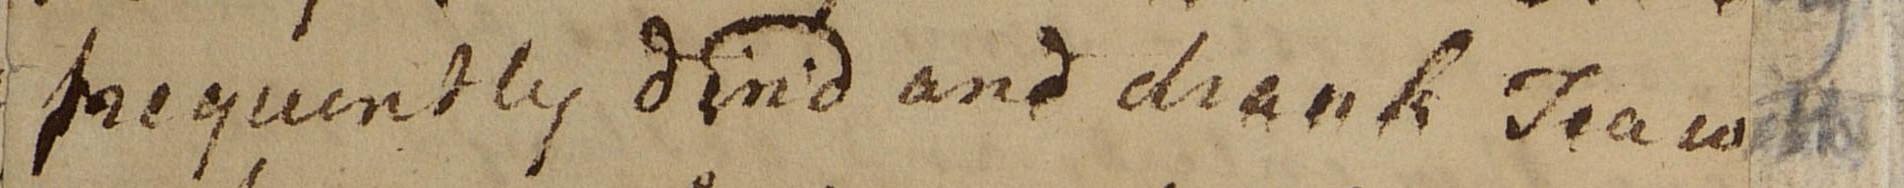frequently din'd and drank Tea with
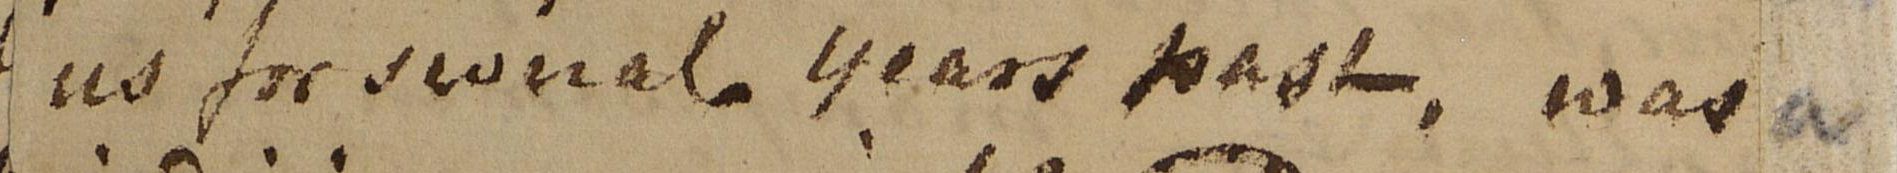us for several years past, was a
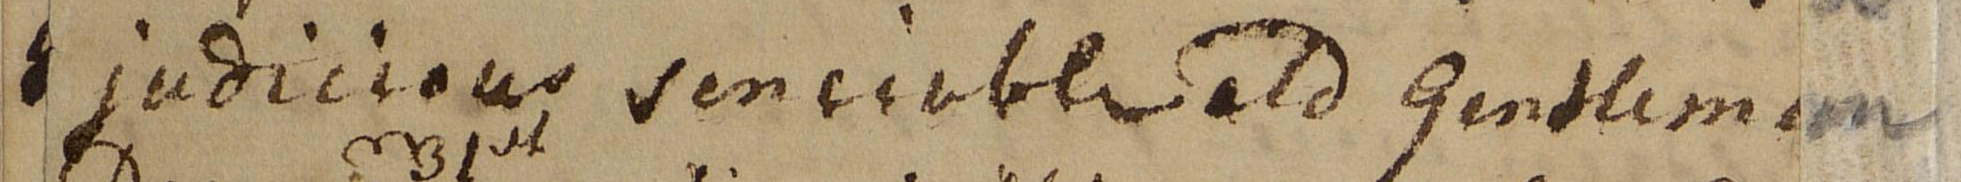judicious senciable and Gentleman
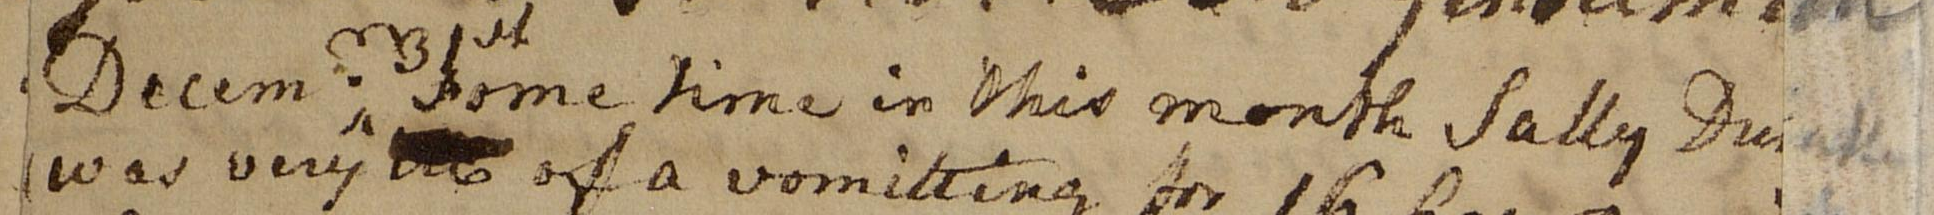Decem^r. ^31^st some time in this month Sally Drinker
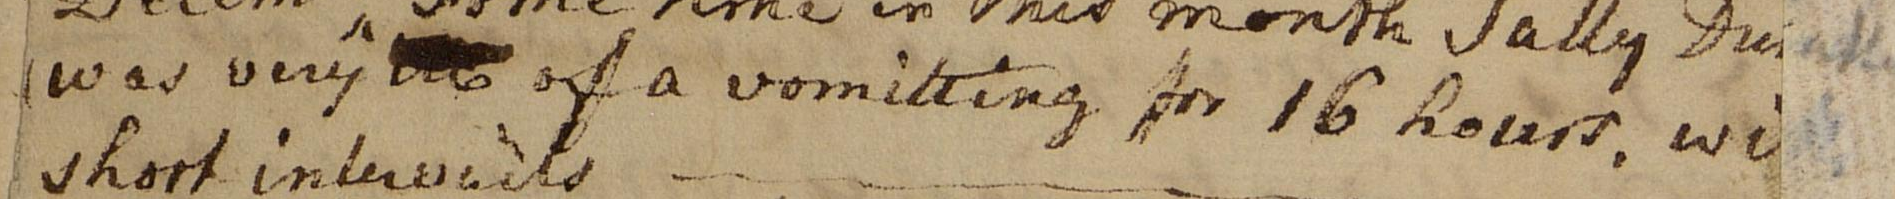was very ill of a vomitting for 16 hours, with
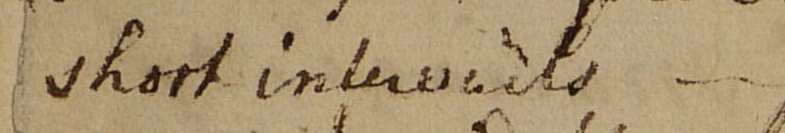short intervails-
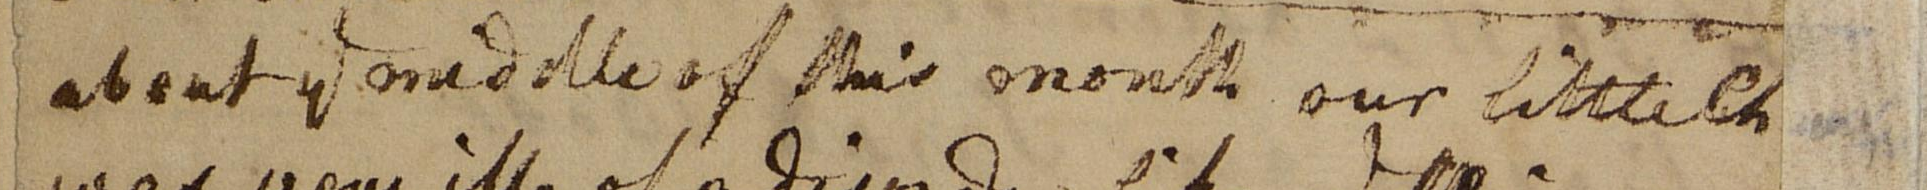about y^e middle of this month our little Ch[___]
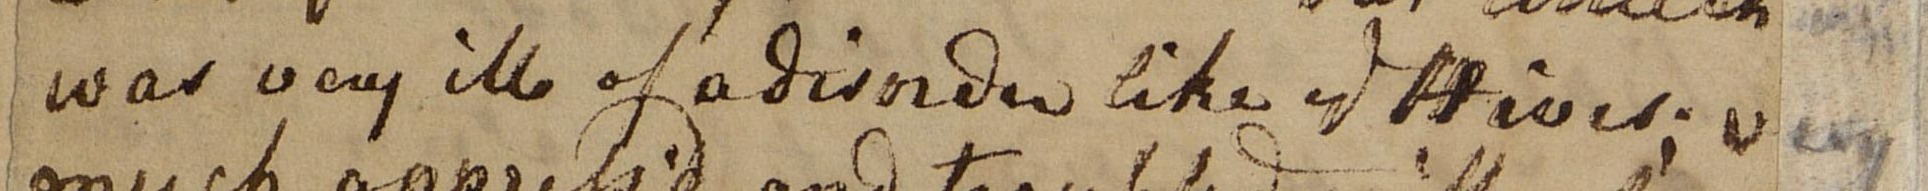was very ill of a disorder like y^e Hives; very
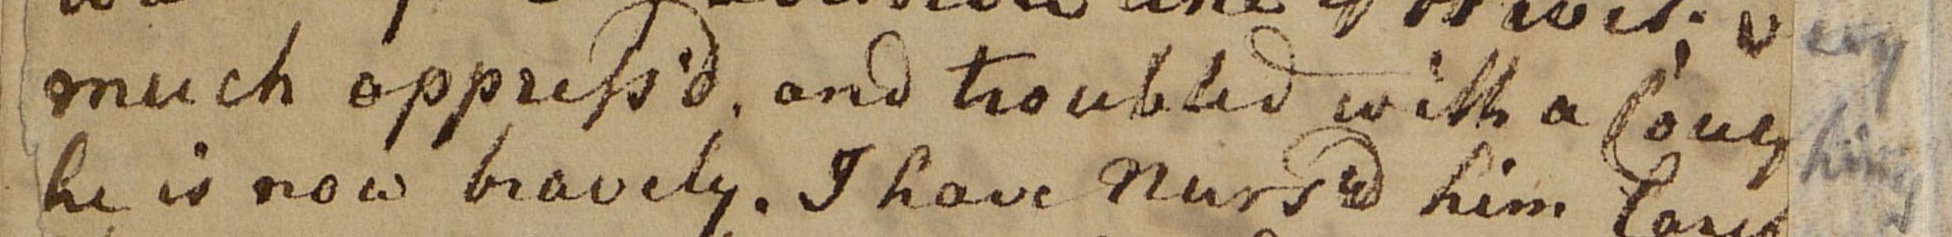much oppress'd, and troubled with a Coughing
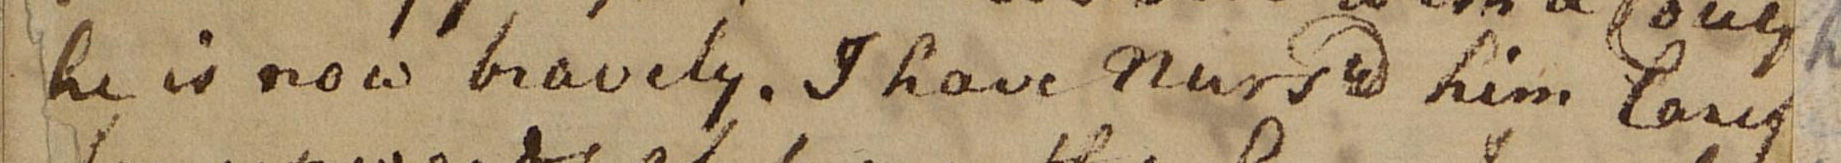he is now bravely. I have nurs'd him Caref
